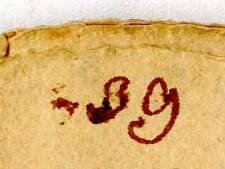39
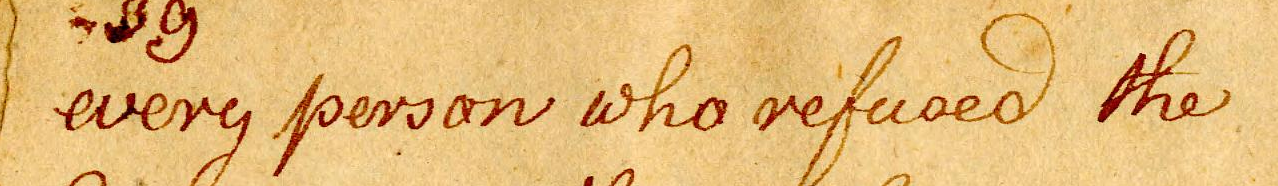every person who refused the
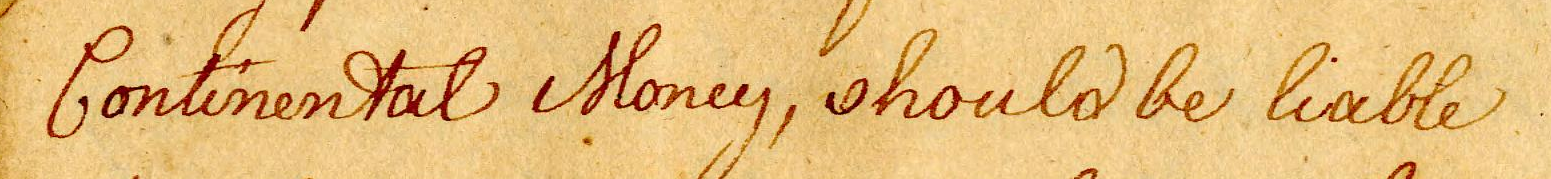Continental Money, should be liable
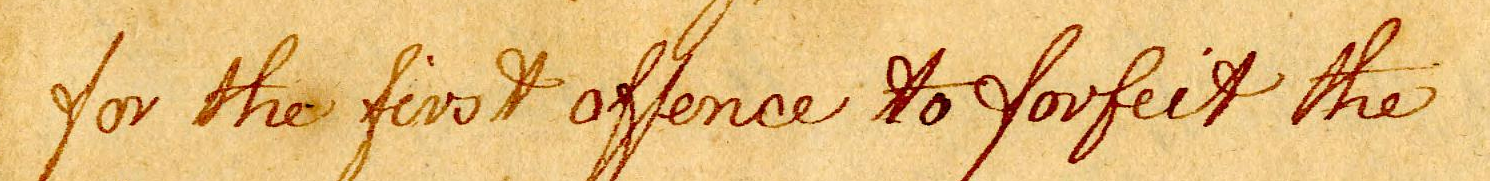for the first offence to forfeit the
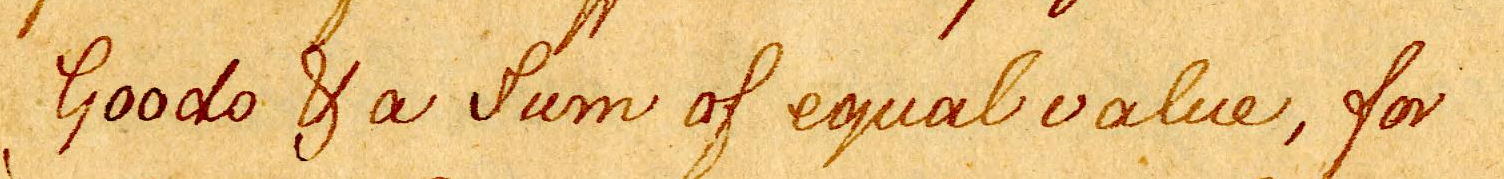Goods & a Sum of equal value, for
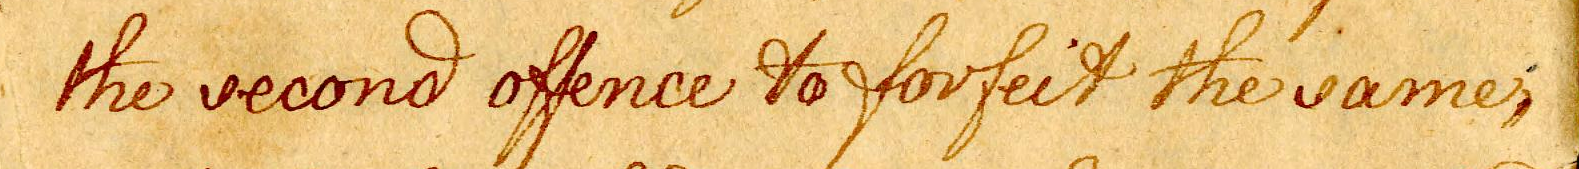the second offence to forfeit the same,
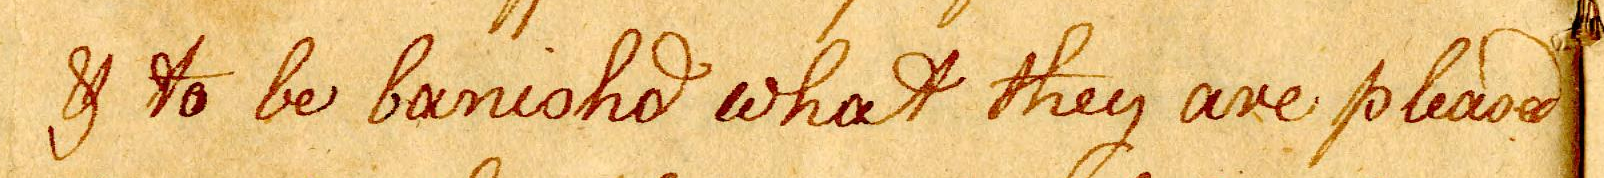& to be banished what they are pleased
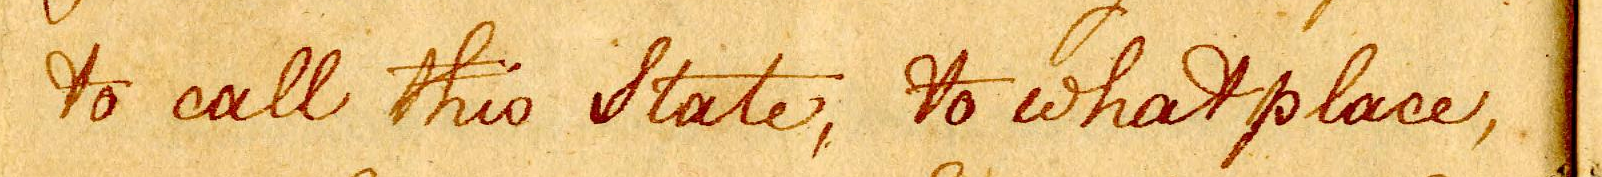to call this State, to what place,
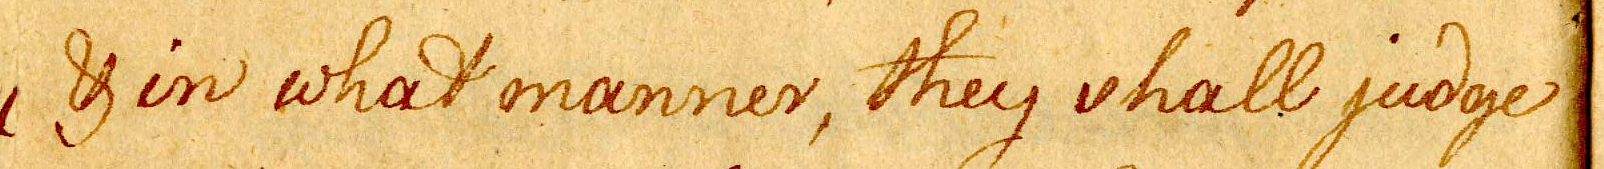& in what manner, they shall judge
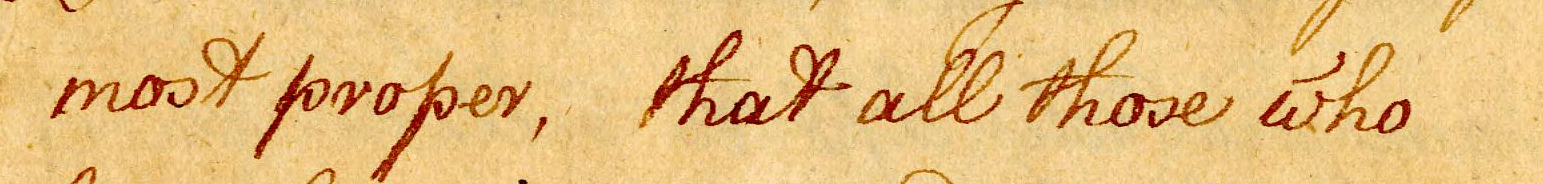most proper, that all those who
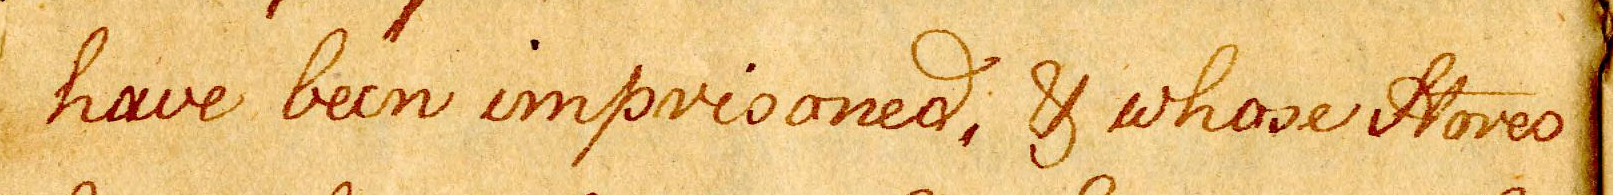have been imprisoned, & whose Stores
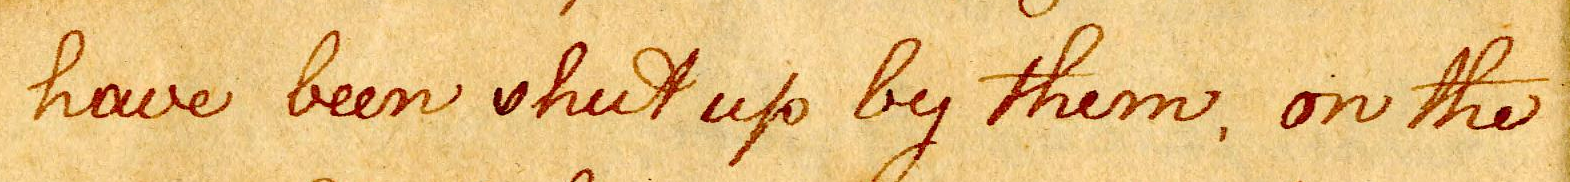have been shut up by them, on the
